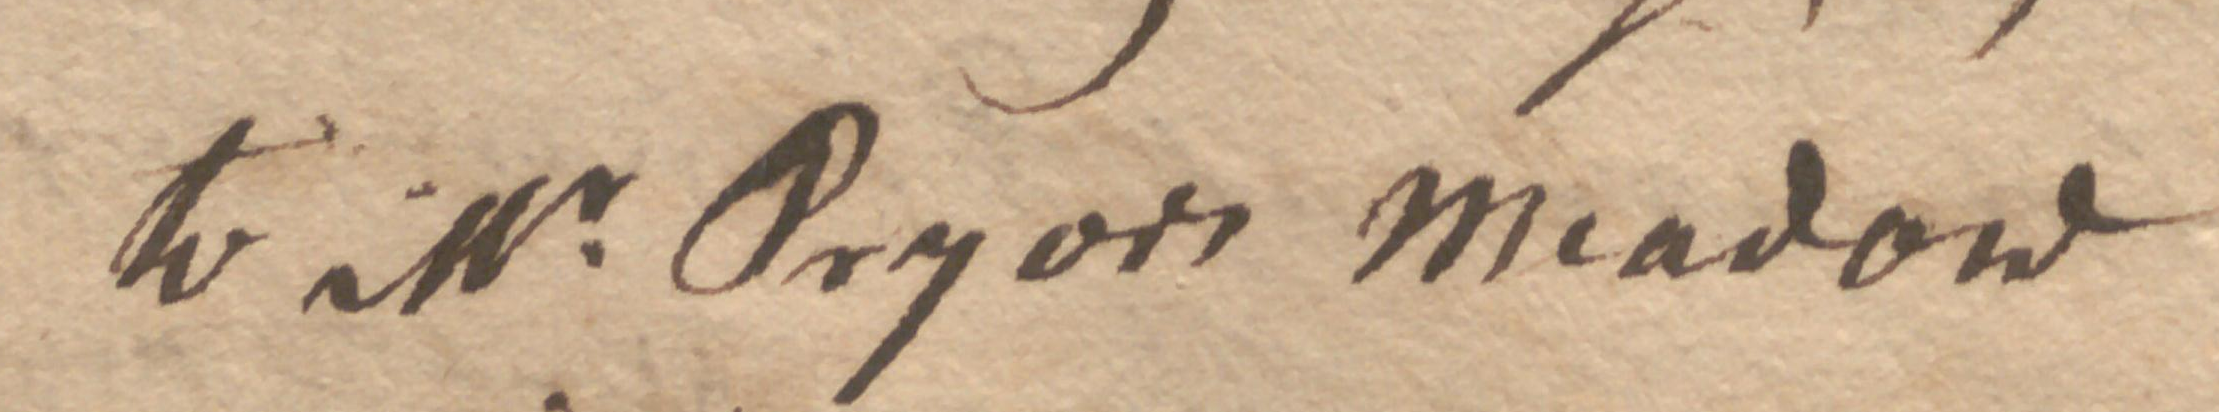to M^r. Pryors Meadow
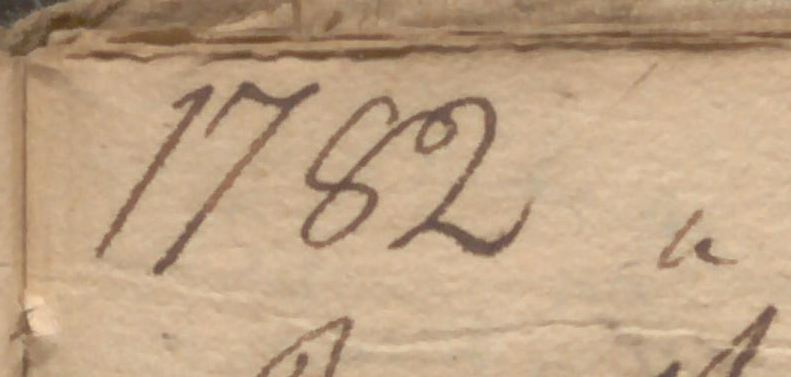1782
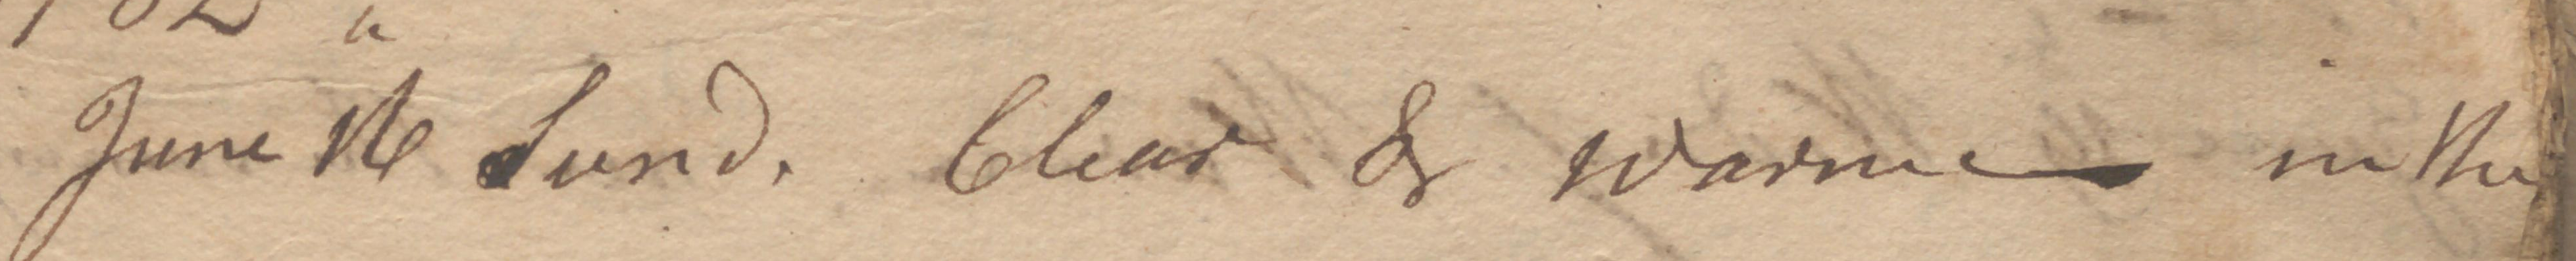June 16 Sund. Clear & warme- in the
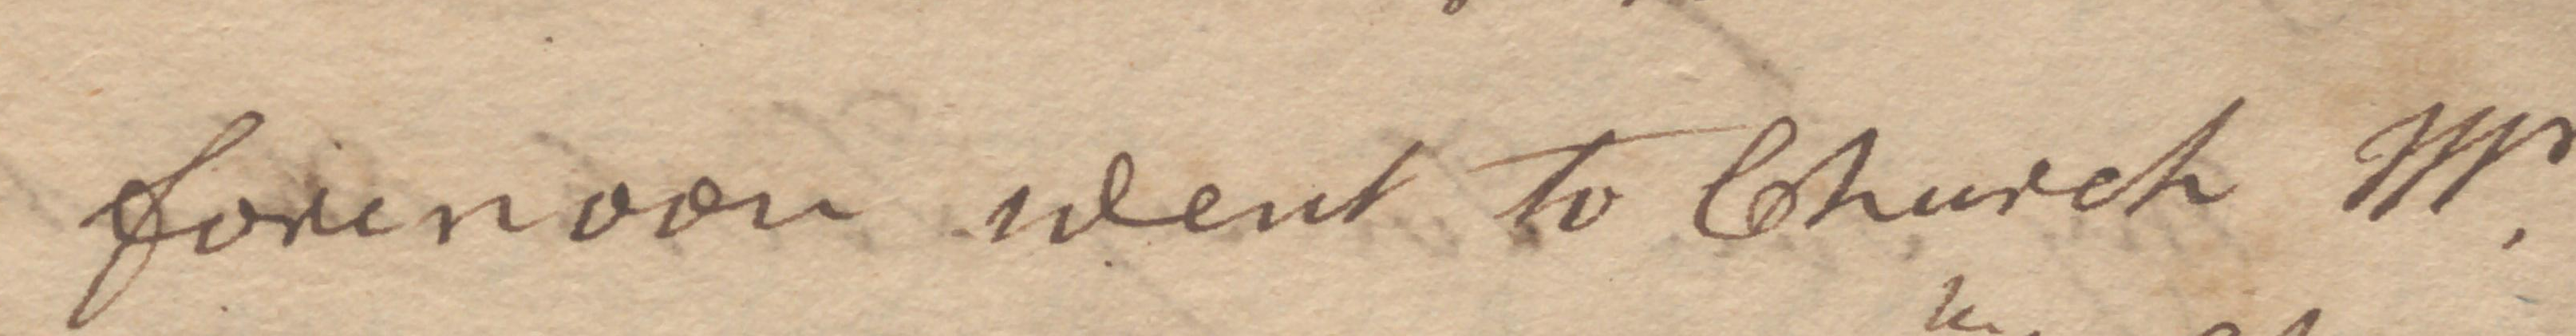forenoon went to Church M^r.
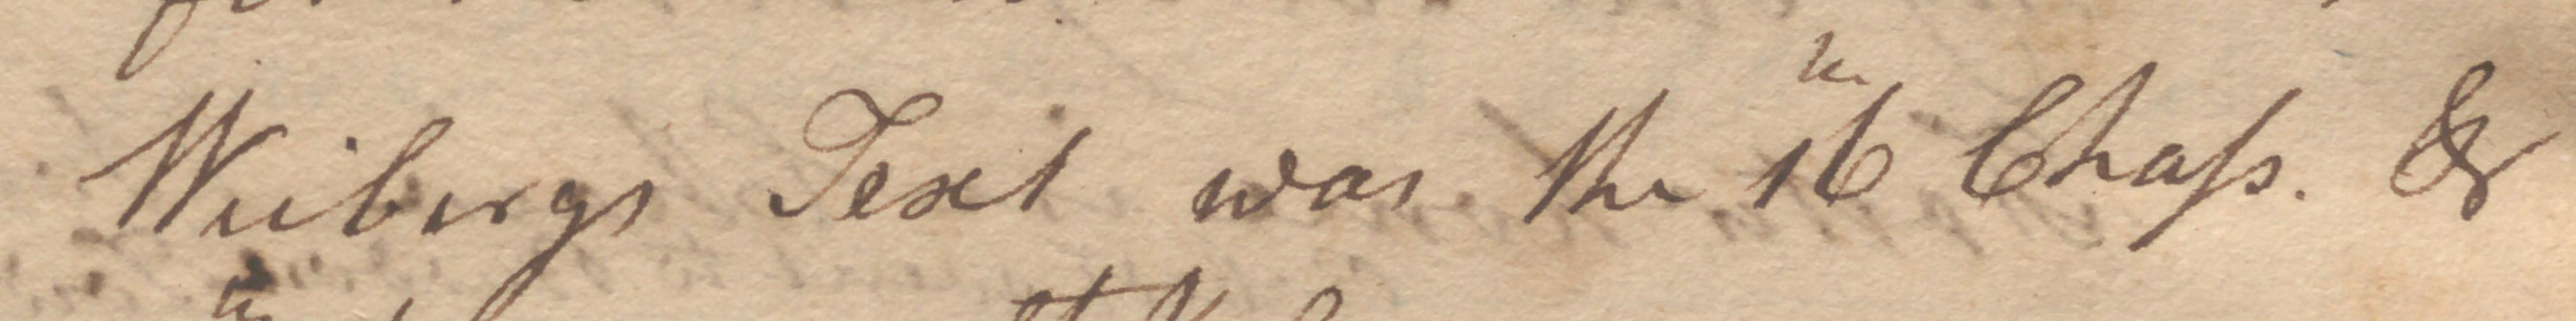Weibergs Text was the 16^th Chap. &
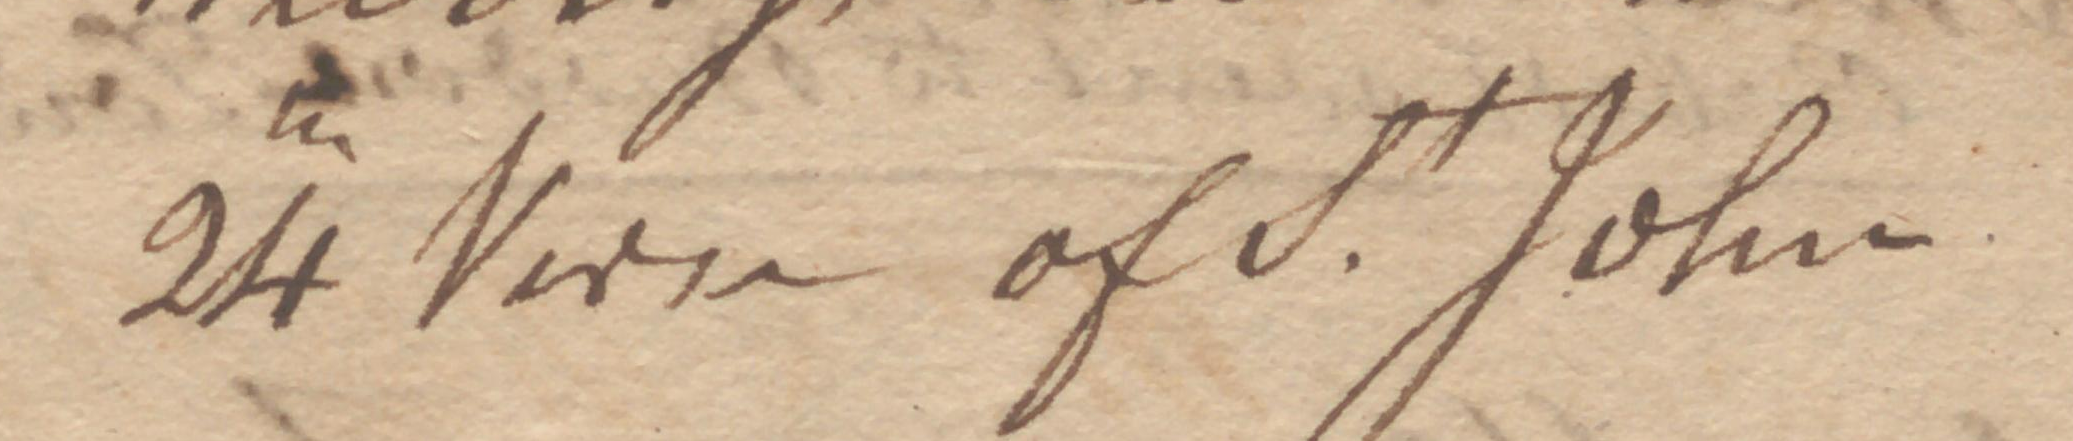24^th Verse of S^t. John
